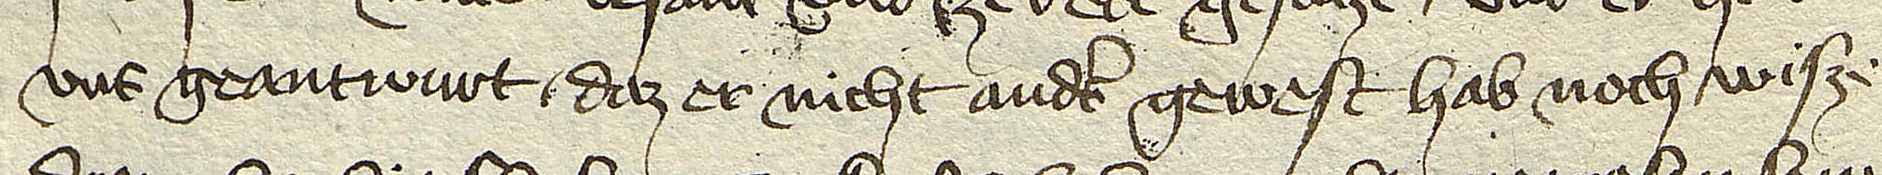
vns geantwurt / daʒ er nicht ands* geweſt hab noch wiſʒe
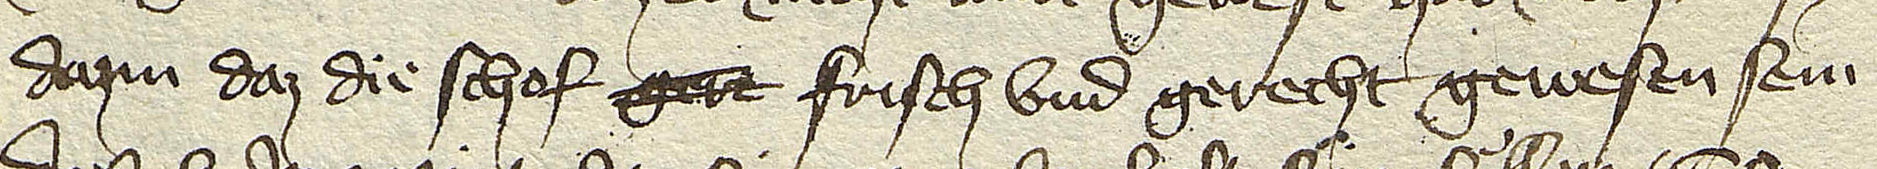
dann daʒ die ſchof gere friſch vnd gerecht geweſen ſein
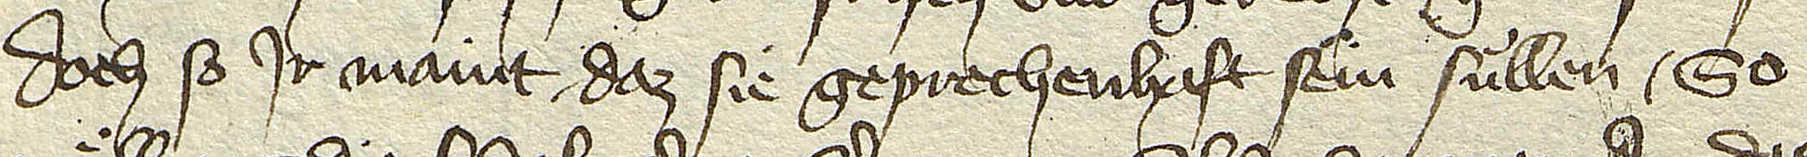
doch ſo Ir maint / daʒ ſie geprechenhaft ſein ſüllen / So
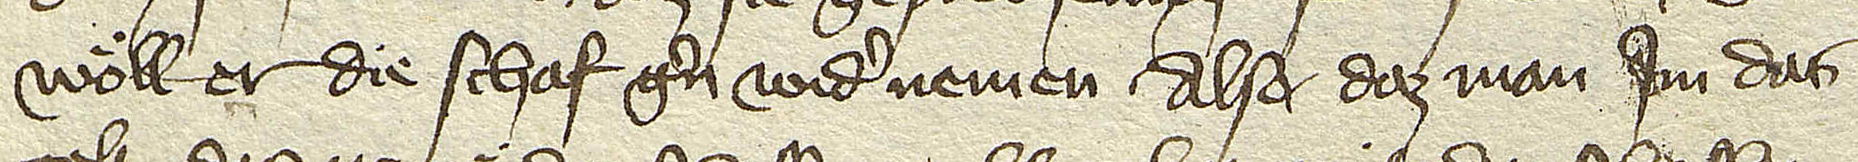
wöll er die ſchaf g*n wid* nemen / Alſo / daʒ man Im das
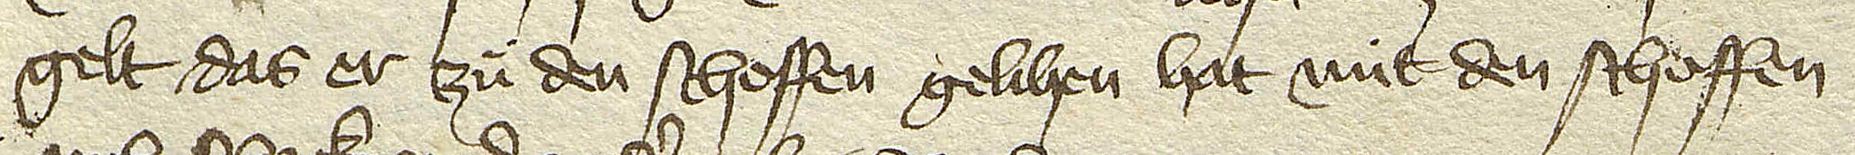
gelt / das er cʒü den ſchoffen gelihen hat mit den ſchoffen
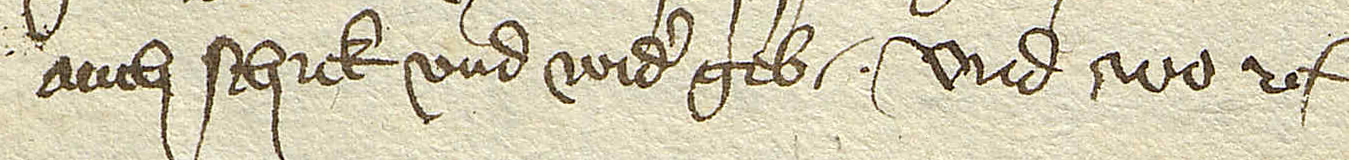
auch ſchick vnd wid* geb / . vnd wo ec*
